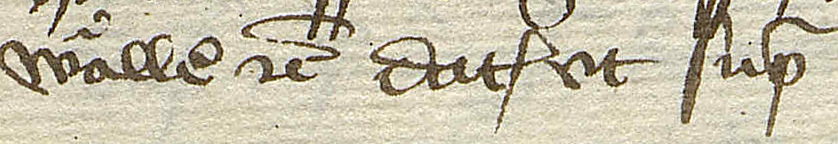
wölle* ec* dat* vt ſup*
